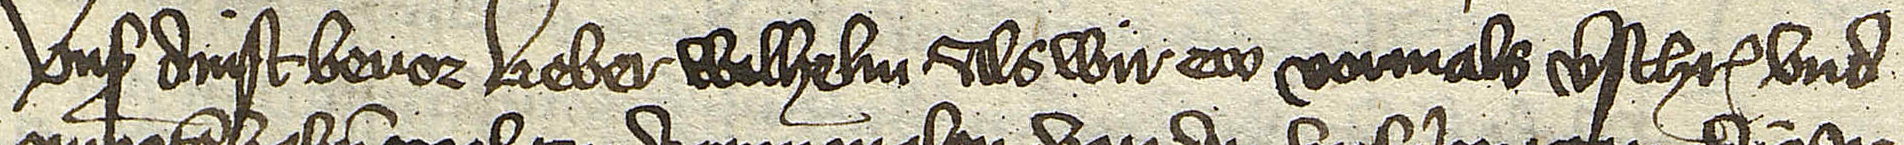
Vnſ* dinſt beuor Lieber wilhelm / Als wir ew vormals v*ſchr* vnd
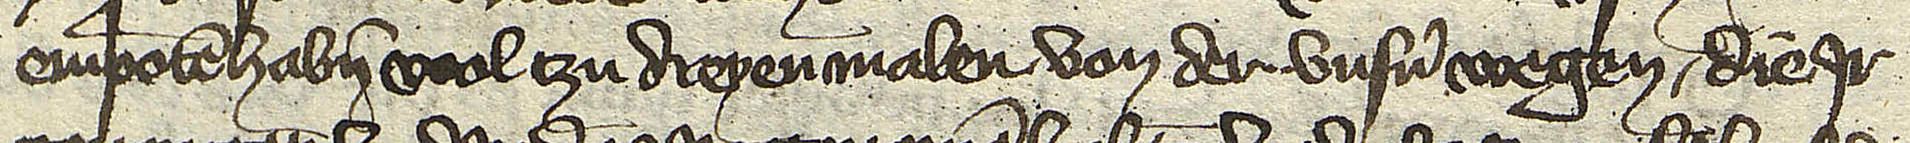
empote* habn* wol cʒu dreyen malen / von der ~ vnſn* wegen / die Ir
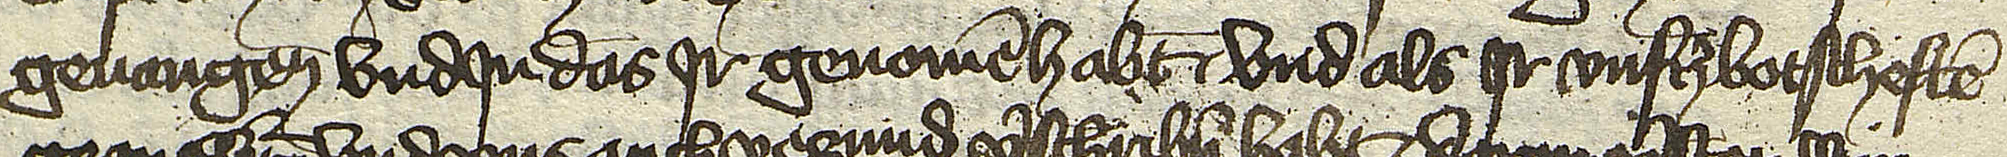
geuangen vnd In das Ir genome* habt / vnd als Ir vnſn* botſchefte*
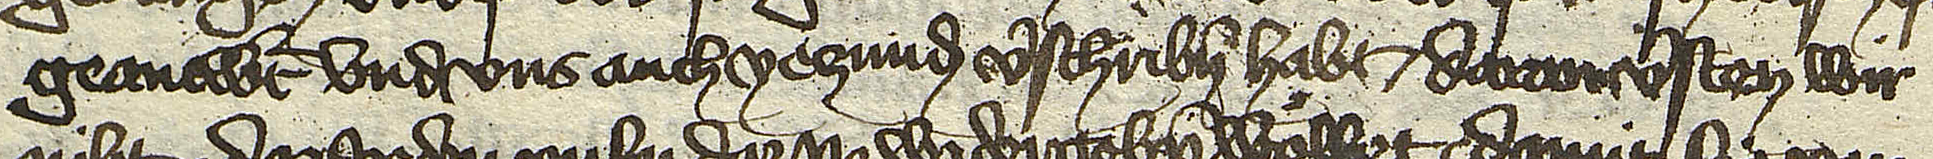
geantwt* vnd vns auch yecʒund v*ſchribn* habt / daran v*ſten wir
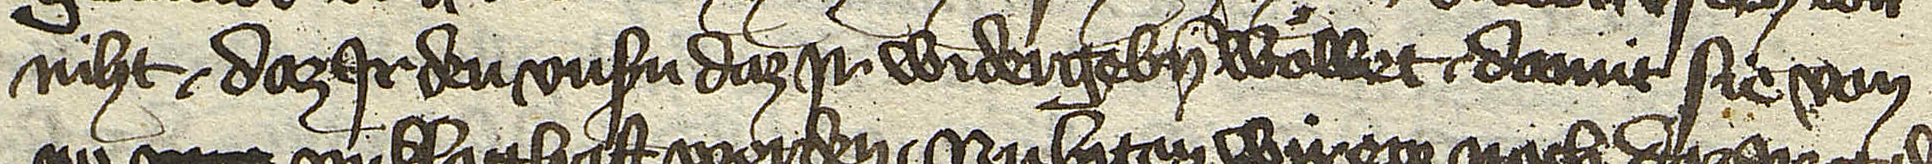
niht / daʒ Ir den vnſ*n daʒ Ir widergebn* wöllet / damit ſie von
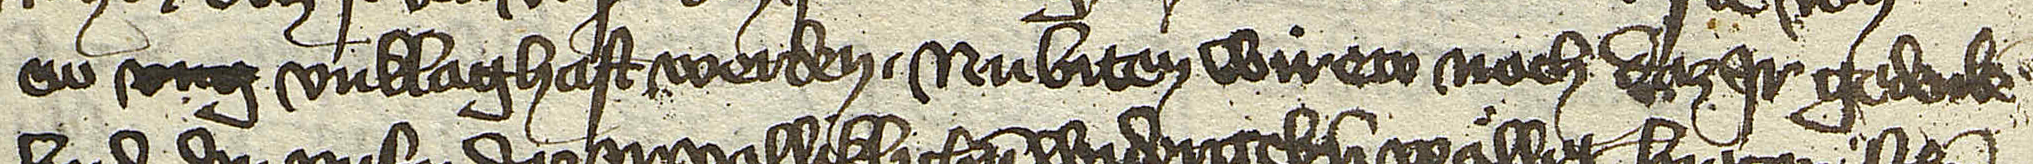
ew vng vnklaghaft werden / Nu biten wir ew noch daʒ Ir gedenke*
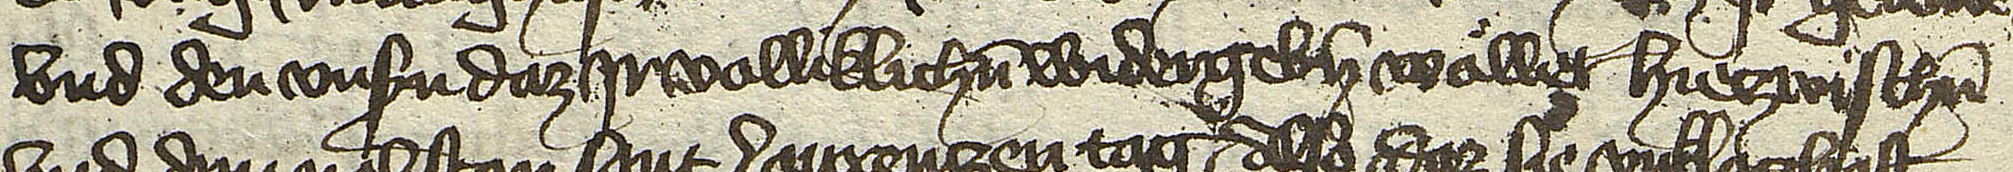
vnd den vnſ*n daʒ Ir volliklichn* widergebn* wöllet hiecʒwiſchn*
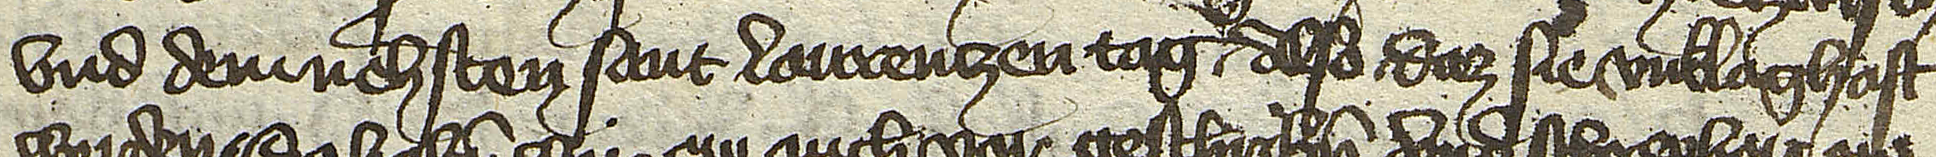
vnd dem nehſten ſant Laurencʒen tag / Alſo / daʒ ſie vnklaghaft
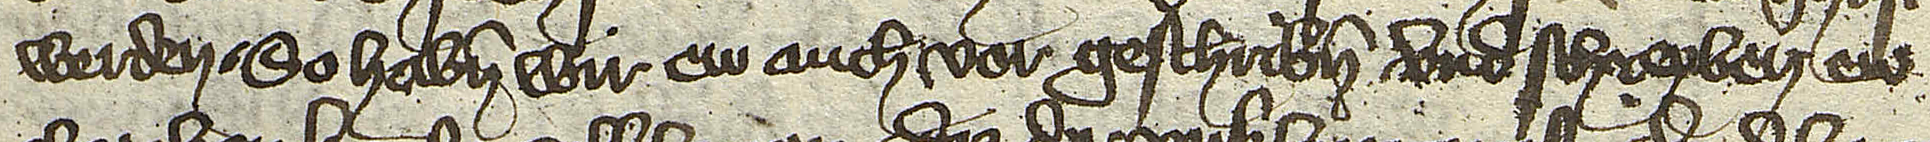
werden / So habn* wir ew auch vor geſchribn* / vnd ſchreyben ew
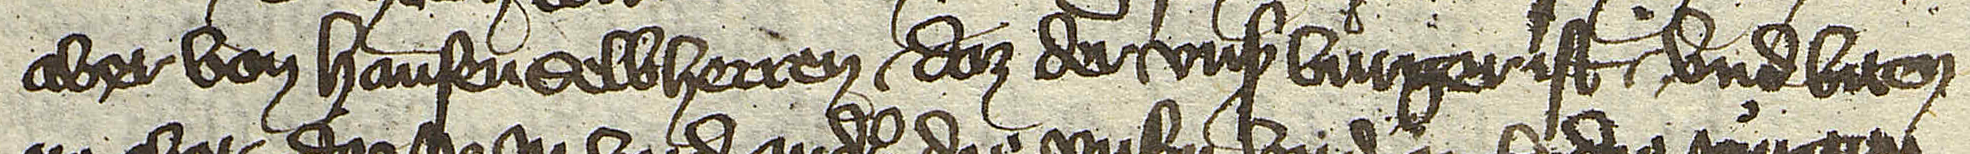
aber von hanſen Selbherren / daʒ der vnſ* burger iſt / vnd biten
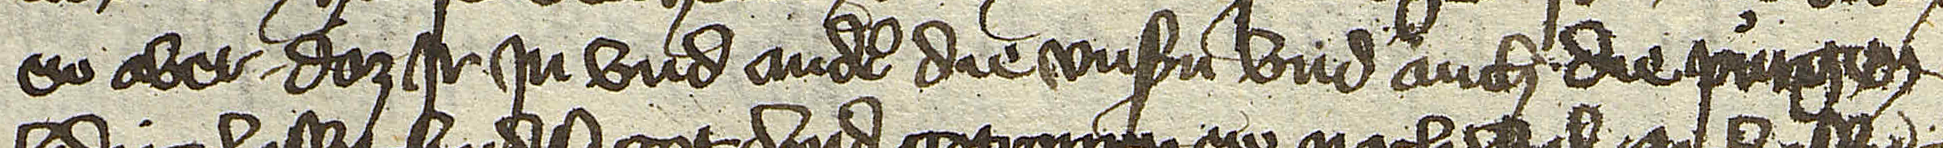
ew aber / daʒ Ir In vnd ande* die vnſ*n vnd auch die pürgen
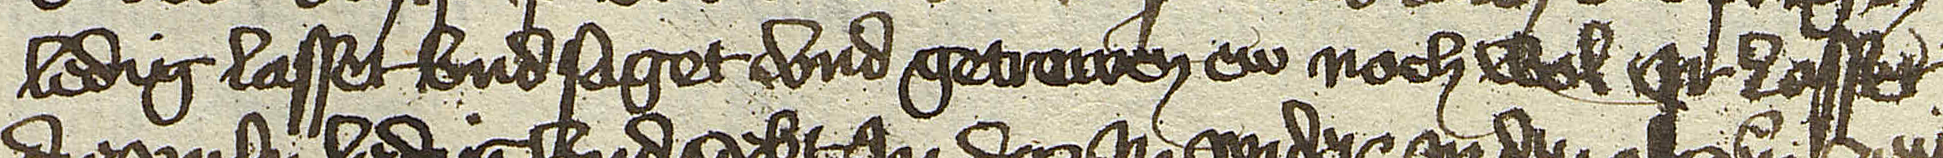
ledig laſſet vnd ſaget / vnd getrewen ew noch wol Ir laſſet
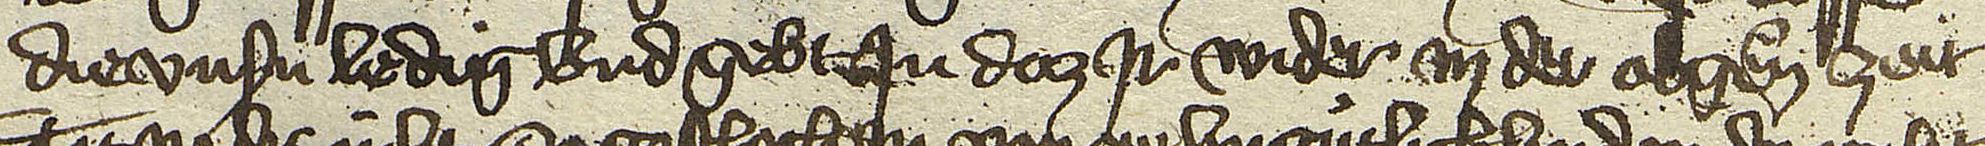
die vnſ*n ledig vnd gebt In daʒ Ir wider in der abgen* cʒeit
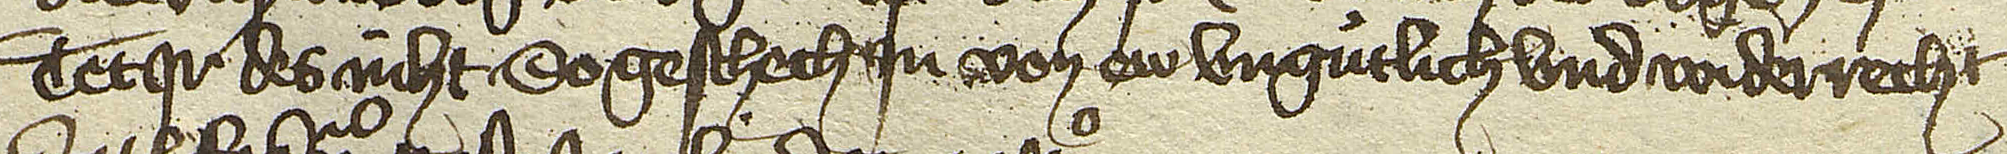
Tet Ir des niht / So geſchech In von ew vngütlich vnd widerrecht
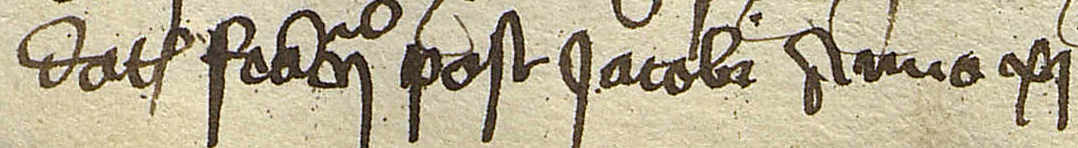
dat* fea* ii* poſt Iacobi Anno xi*
